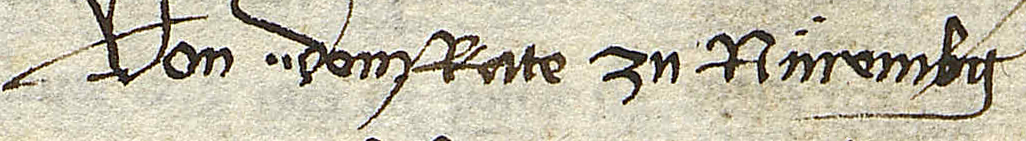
Von ~ dem Rate ʒu Nüremb*g
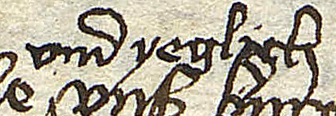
vnd yeglich
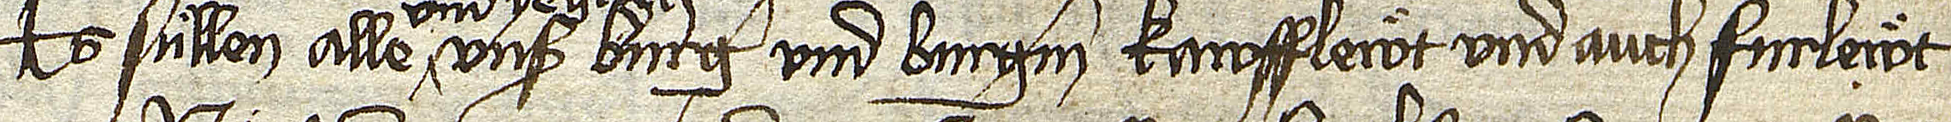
Es ſüllen alle vnſ* burg* vnd burg*in kawfflewt vnd auch furlewt
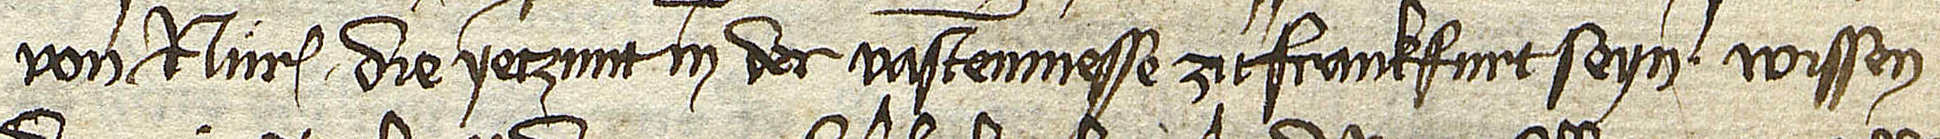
von Nür* / die yecʒunt in der vaſtenmeſſe ʒu frankfurt ſeyn . wiſſen
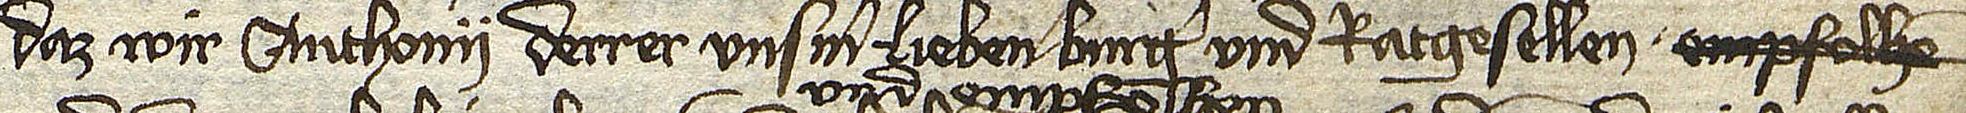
daʒ wir Anthonii Derrer vnſ*m lieben burg* vnd Ratgeſellen . empfohle*
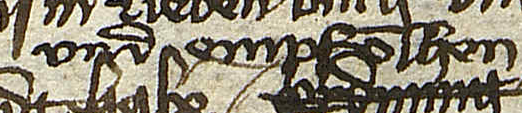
vnd empfolhen
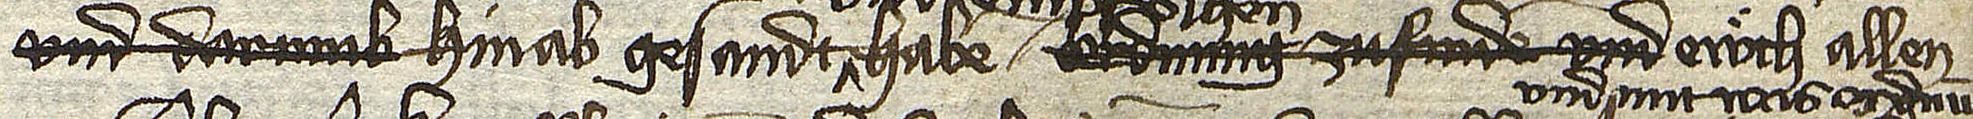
vnd darumb hinab geſandt habe* / ordnung ʒufinde* vnd ewch allen
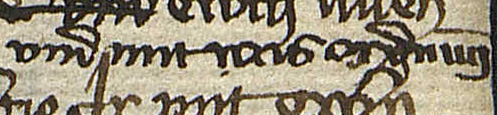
vnd mit was ordnu*g
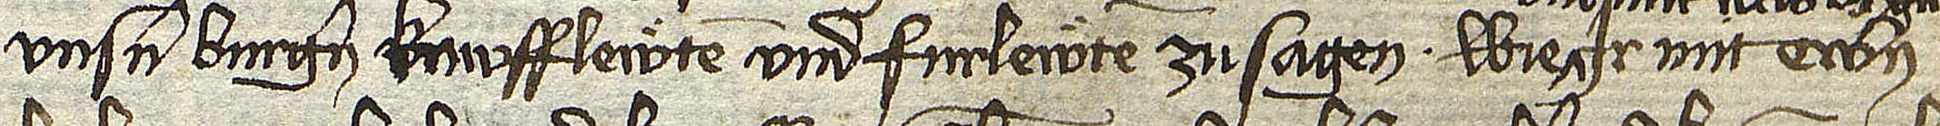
vnſ*n burg*n kawfflewte* vnd furlewte* ʒu ſagen . Wie Ir mit ew*n
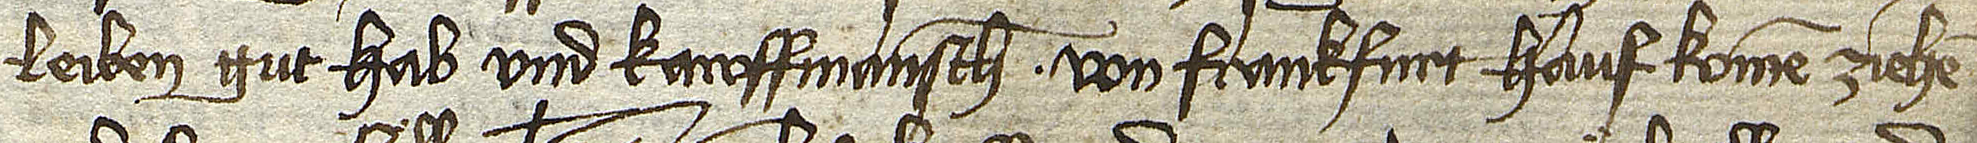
leiben gut hab vnd kawffmanſch* . von frankfurt h*auf kome* ʒiehe*
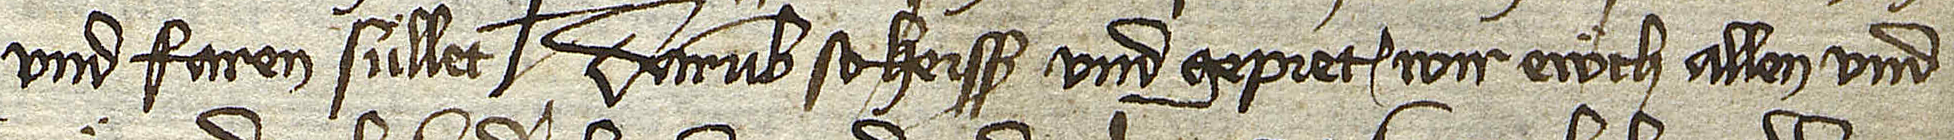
vnd faren ſüllet / Daru*b ſo heiſſ* vnd gepiet* wir ewch allen vnd
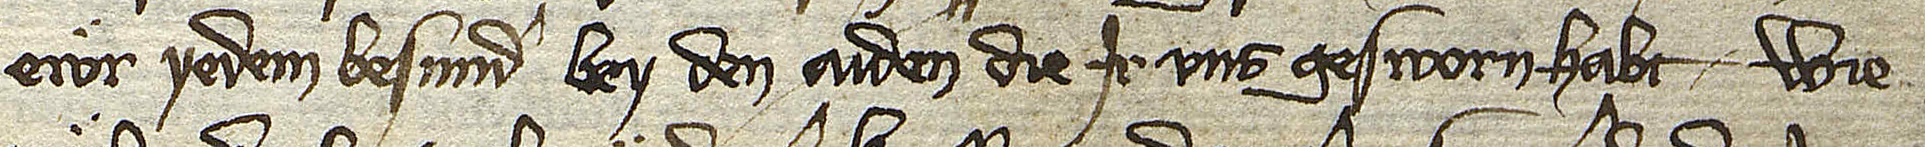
ewr yedem beſund* bey den aiden die Ir vns geſworn habt / Wie
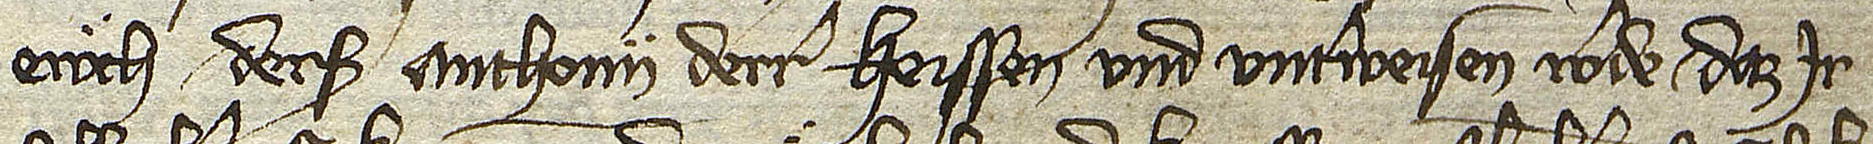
ewch / derſ* anthonii derr* heiſſen vnd vnt*weiſen w*de / daʒ Ir
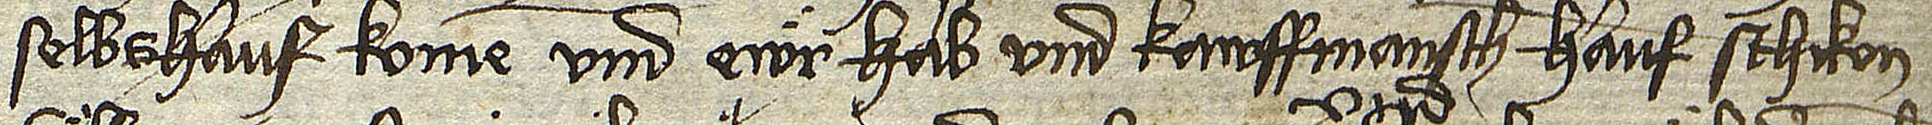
ſelbs h*auf kome* vnd ewr hab vnd kawffmanſch* h*auf ſchiken
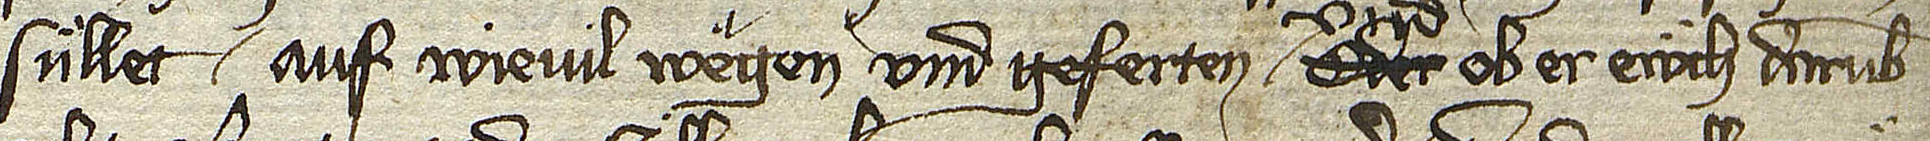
ſüllet / auf wieuil wëgen vnd geferten / Oder ob er ewch daru*b
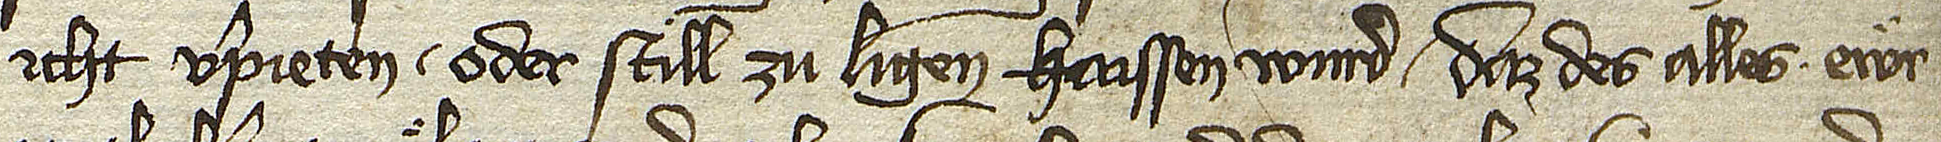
icht v*pieten / oder ſtill ʒu ligen haiſſen wurd / Daʒ des alles . ewr
